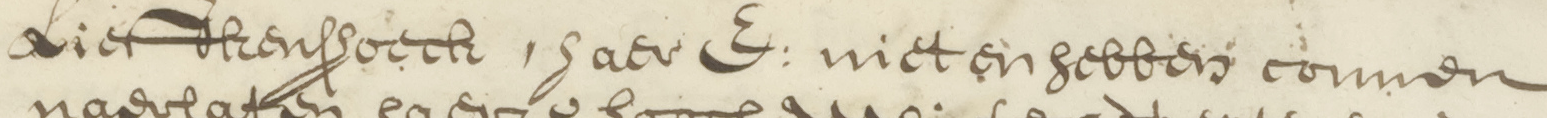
Lieffkenshoeck, haer E: niet en hebben connen
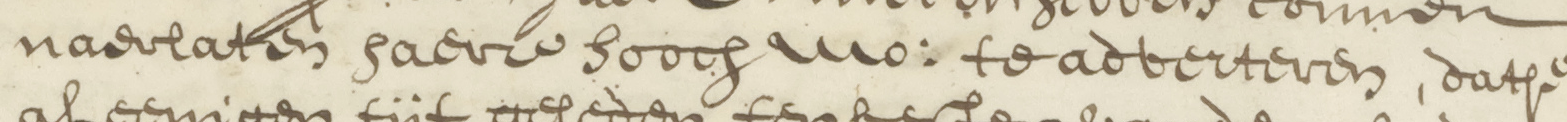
naerlaten haere hoochMo: te adverteren, datse
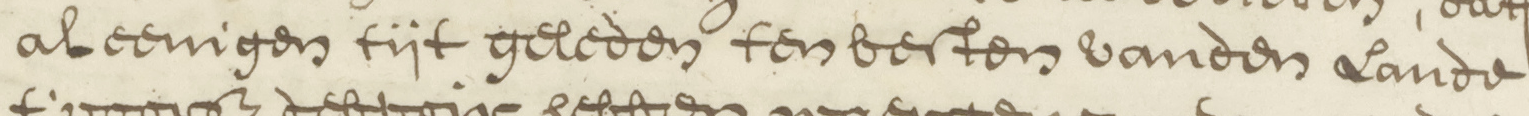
al eenigen tijt geleden ten besten vanden Lande
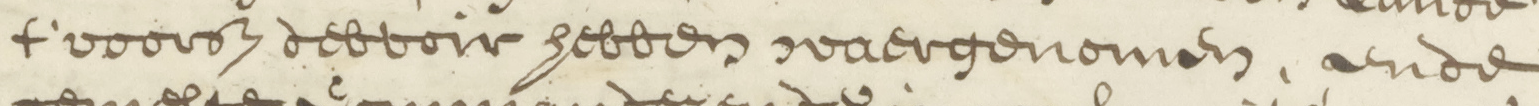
t' voors debvoir hebben waergenomen, ende
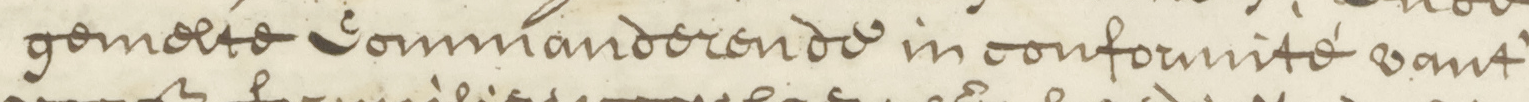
gemelte Commanderende in conformité vant'
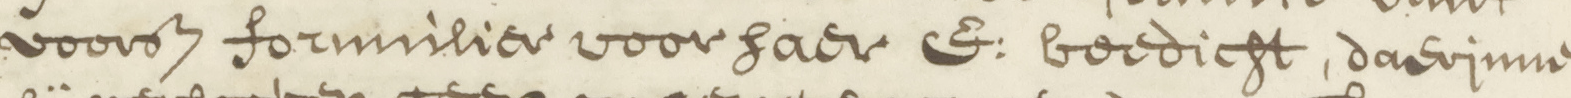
voors formulier voor haer E: beedicht, daerinne
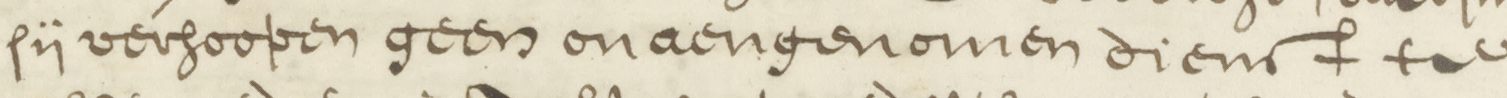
sij verhoopen geen onaengenomen dienst te
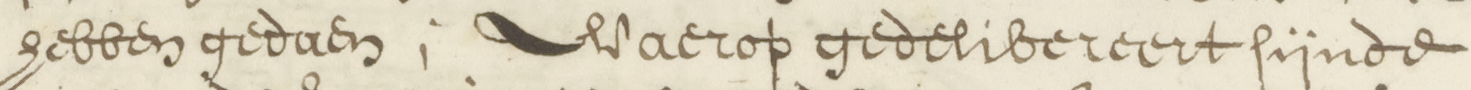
hebben gedaen; Waerop gedelibereert sijnde;
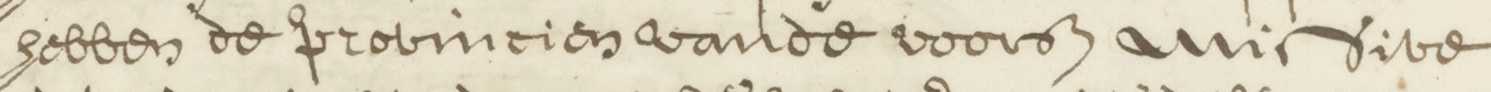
hebben de provincien vande voors Missive
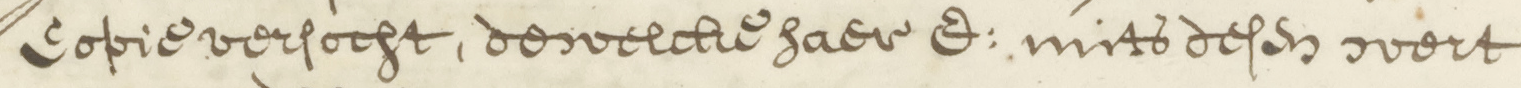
Copie versocht, dewelcke haer E: mits desen wert
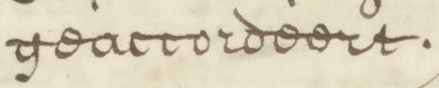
geaccordeert.
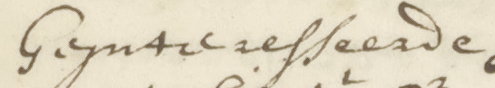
Geinteresseerde
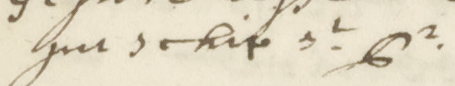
het schip st. Pr.
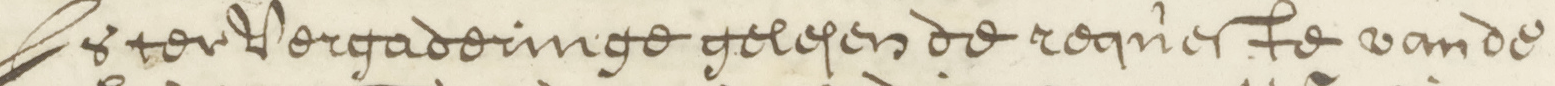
Is ter Vergaderinge gelesen de requeste van de
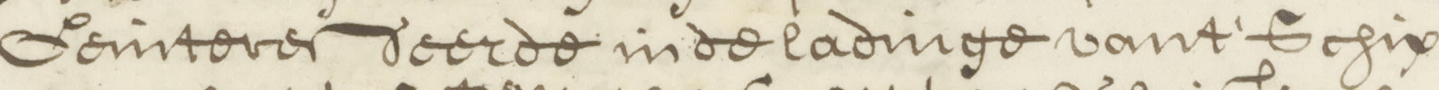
Geinteresseerde in de ladinge vant' Schip
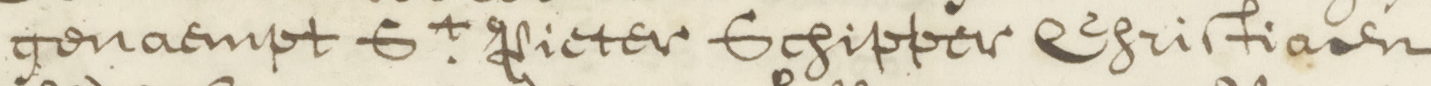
genaempt St. Pieter Schipper Christiaen
